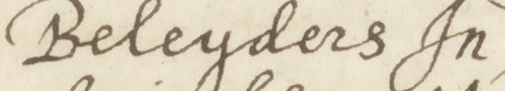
Beleijders in
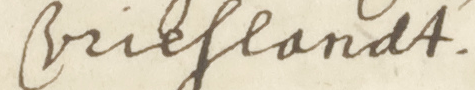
Vrieslandt.
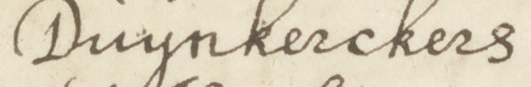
Duijnkerckers
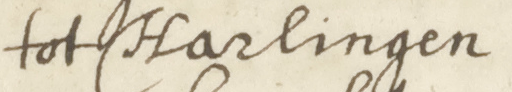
tot Harlingen
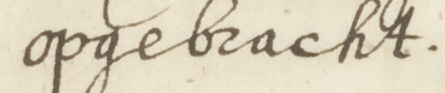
opgebracht.
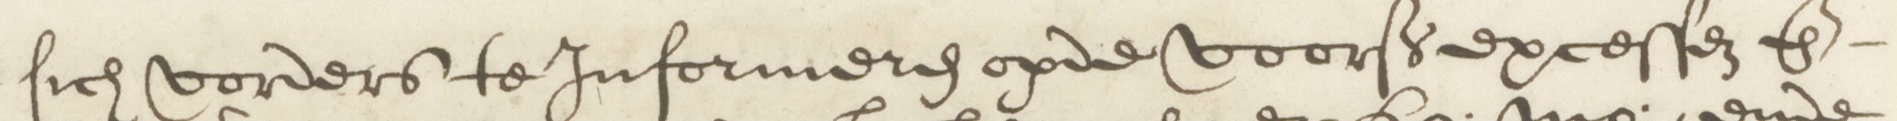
sich vorders te Informeren opde voorsz. excessen & =
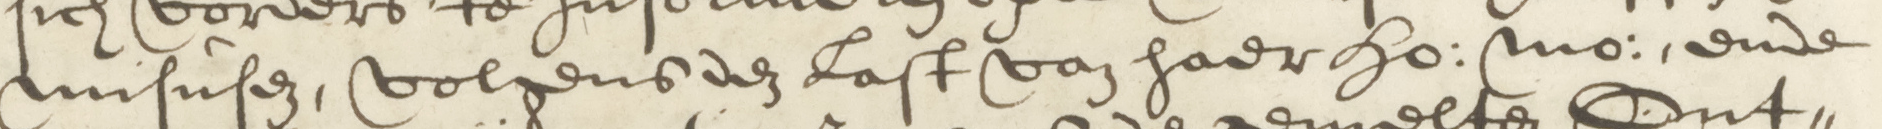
misusen, volgens den Last van haer Ho:Mo: ende
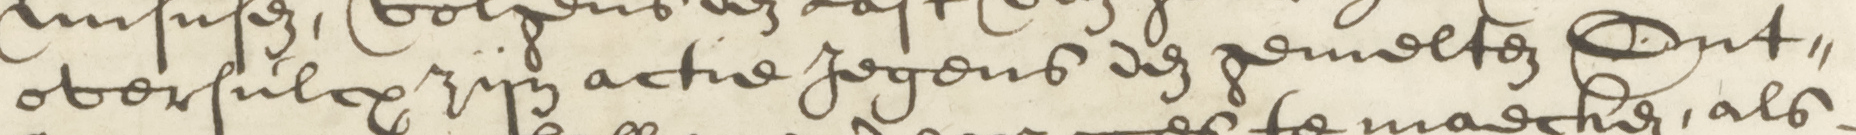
oversulcx zijn actie Jegens den gemelten Ont„
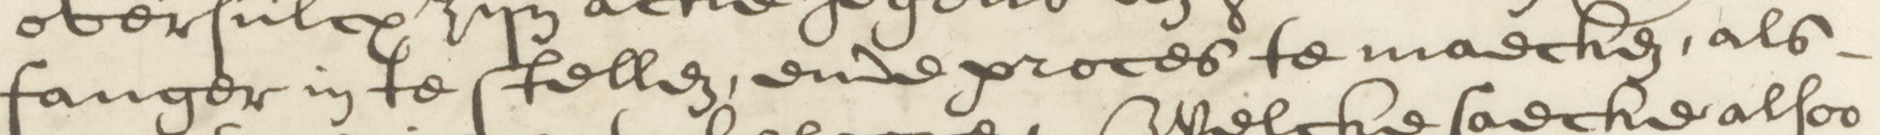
fanger in te stellen, ende proces te maecken, als -
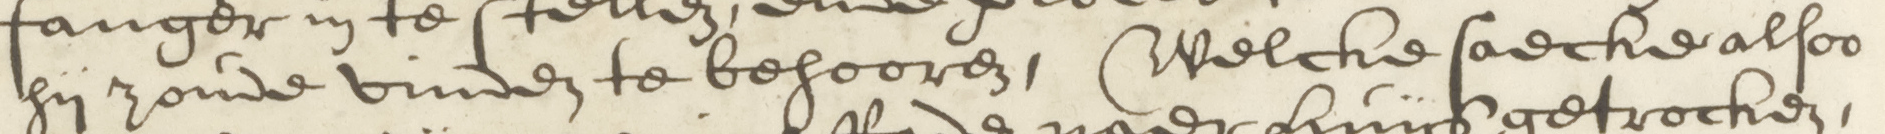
hij zoude vinden te behooren. Welcke saecke alsoo
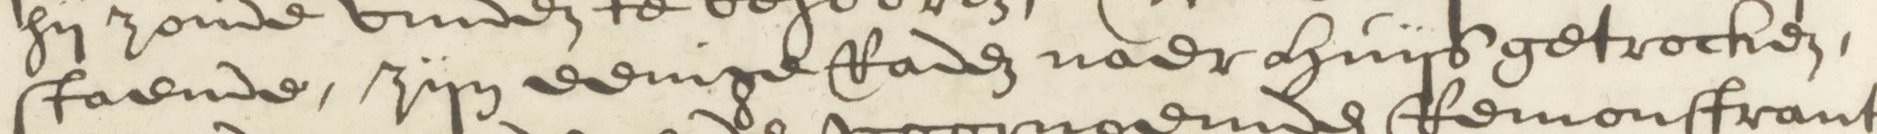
staende, zijn eenige Raden naer huijs getrocken
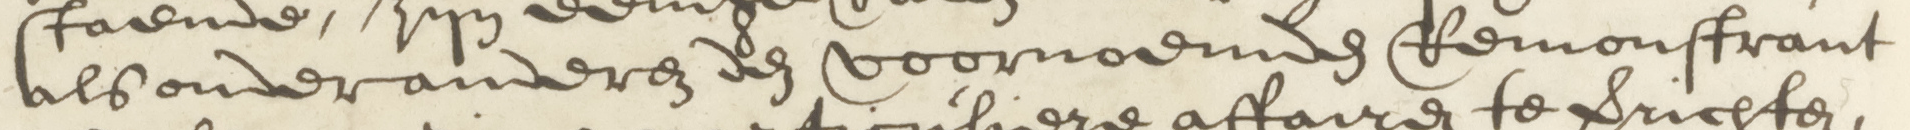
als onder anderen den voornoemden Remonstrant
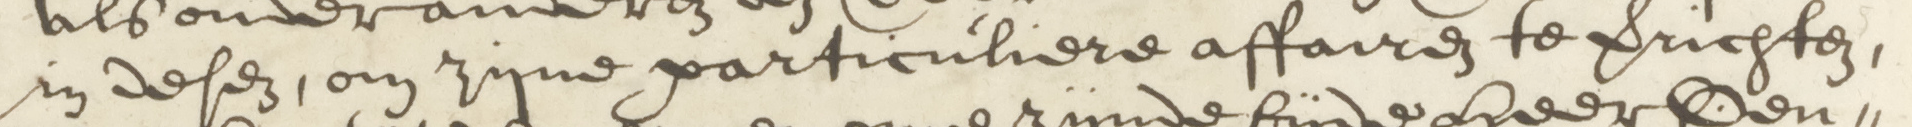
in desen, om zijne particuliere affairen te vrichten,
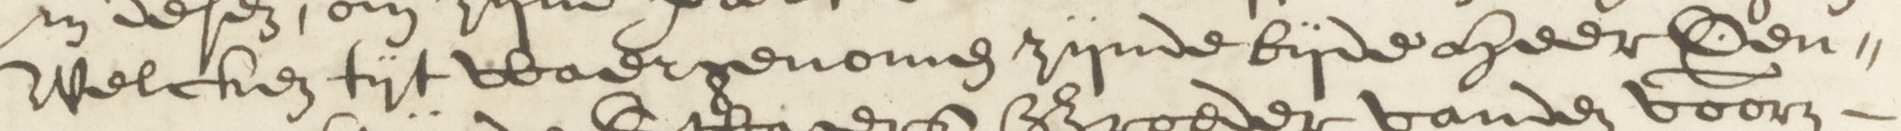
Welcken tijt waergenomen zijnde bijde heer Oen„
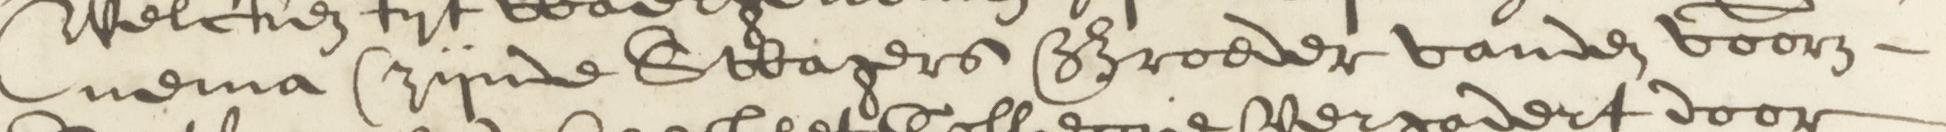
nema (zijnde Swagers Broeder vanden voorn -
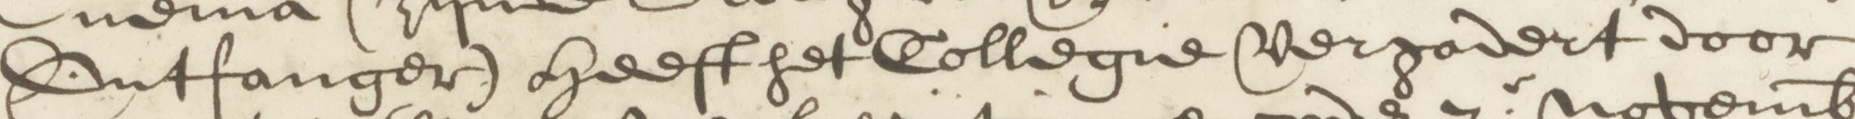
Ontfanger) heeft het Collegie vergadert door
